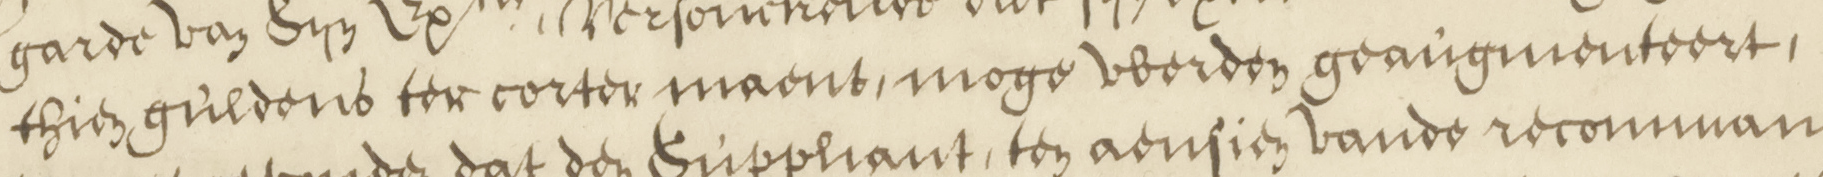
thien guldens ter corter maent, moge werden geaugmenteert,
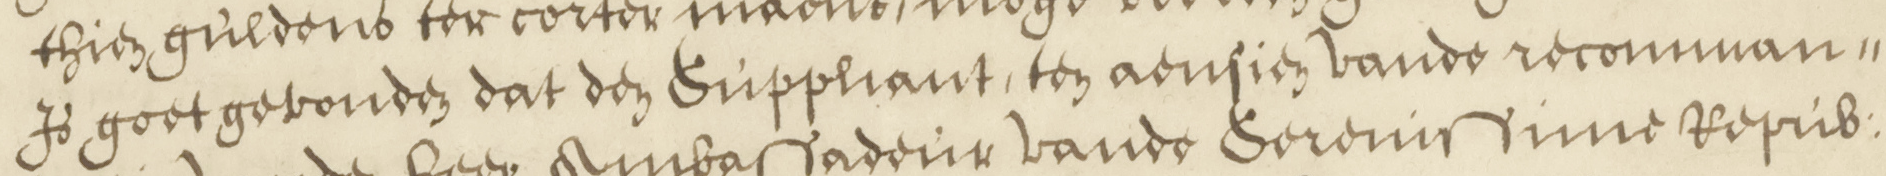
Is goegevonden dat den Suppliant, ten aensien vande recomman„
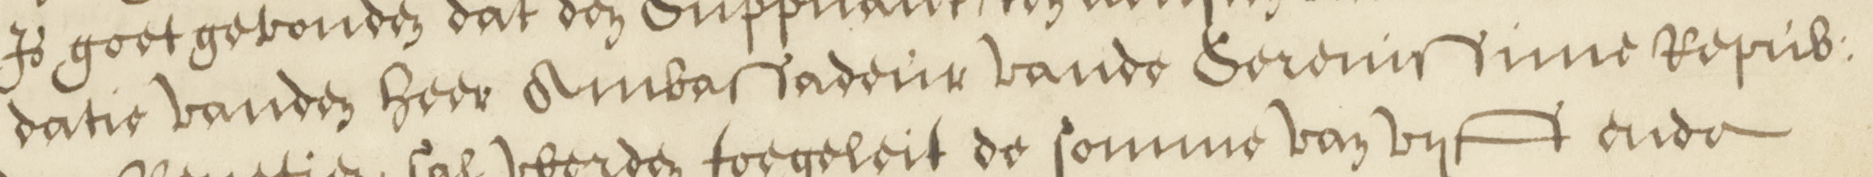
datie vanden heer Ambassadeur vande Serenissime Repub:
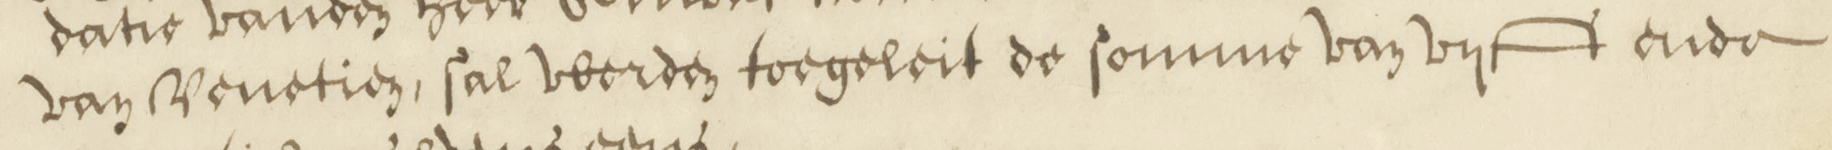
van Venetien, sal werden toegeleit de somme van vyff ende
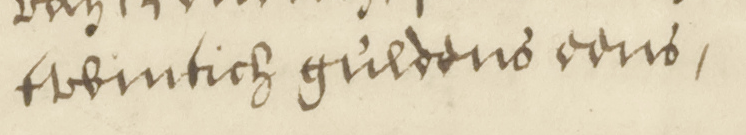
twintich guldens eens.
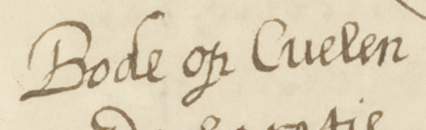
Bode op Cuelen
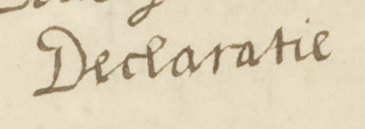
Declaratie
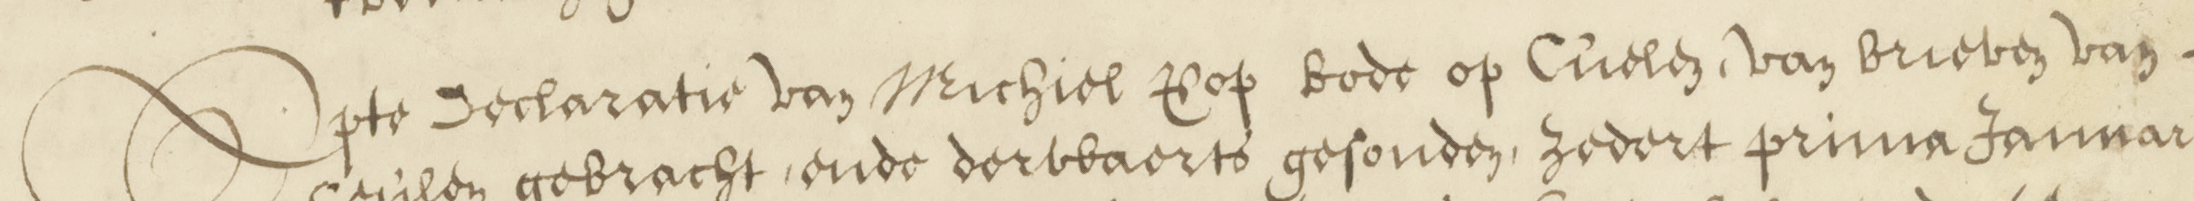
Opte Declaratie van Michiel Pop bode op Cuelen, van brieven van -
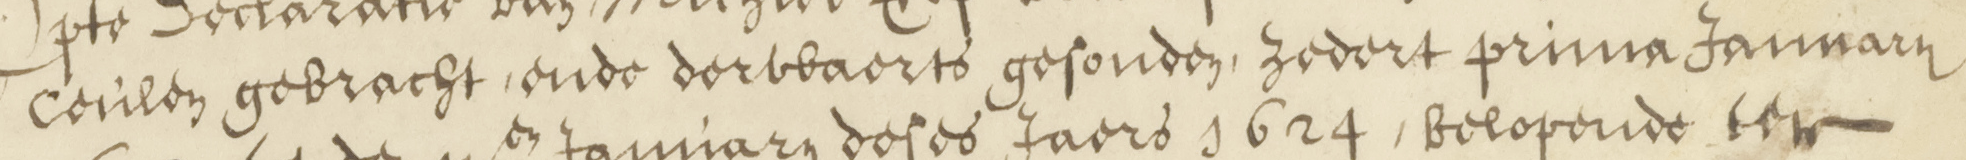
Ceulen gebracht, ende derwaerts gesonden, zedert prima January
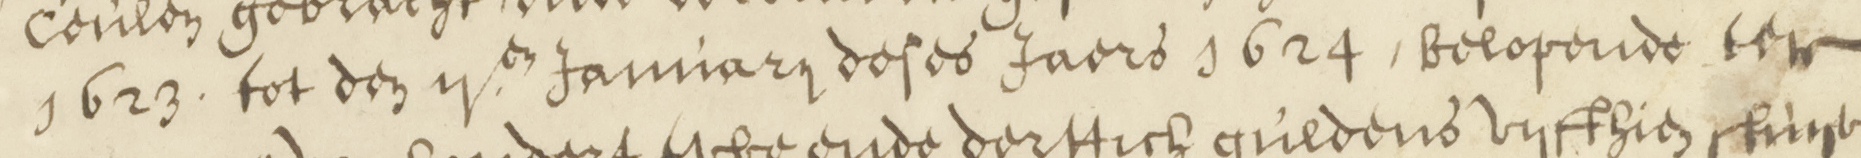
1623. tot den ijen. January deses Jaers 1624, belopende ter
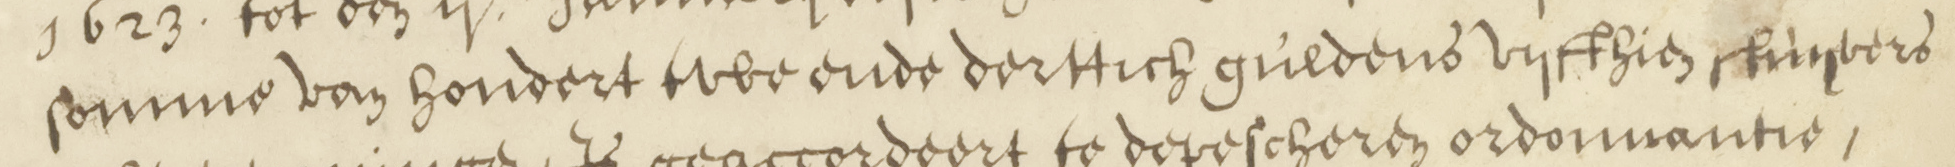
somme van hondert twee ende derttich guldens vyfthien stuyvers
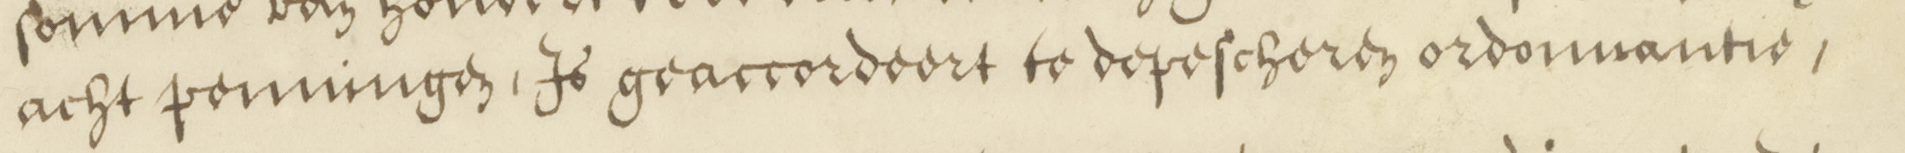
acht penningen, Is geaccordeert te depescheren ordonnantie.
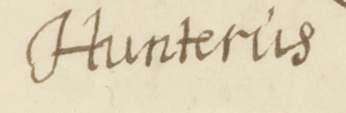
Hunterus
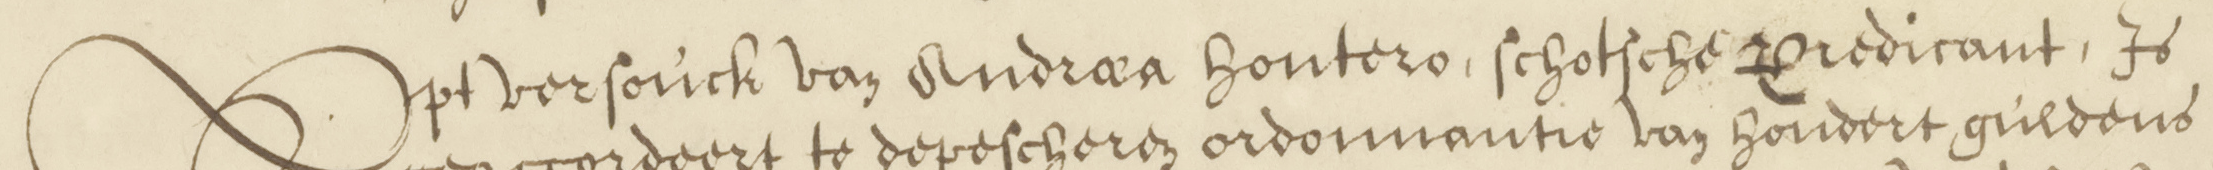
Opt versouck van Andræa Honters, schotsche Predicant, Is
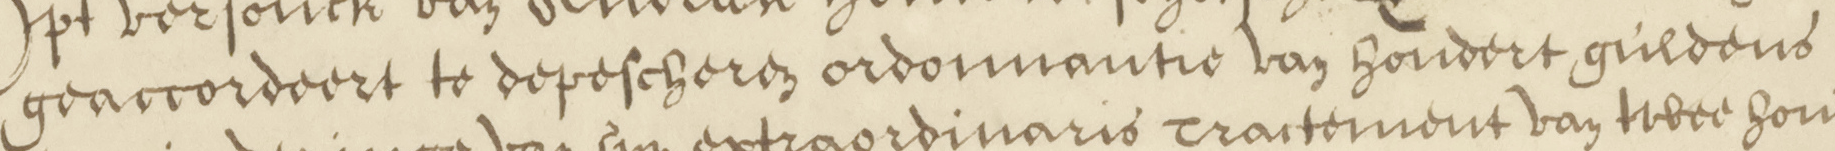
geaccordeert te depescheren ordonnantie van hondert guldens
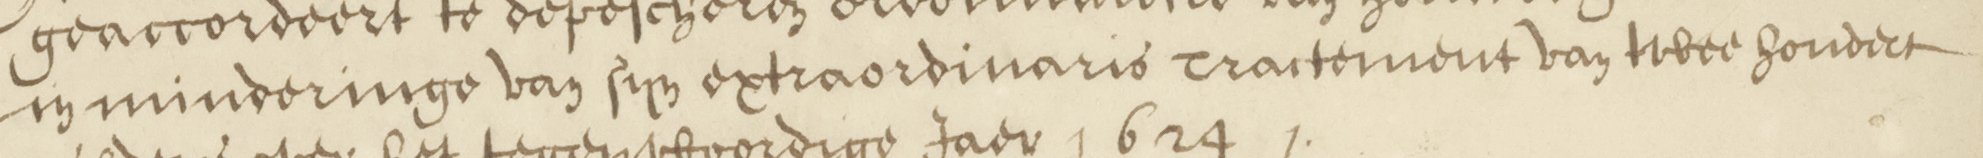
in minderinge van syn extraordinaris tractement van twee hondert
